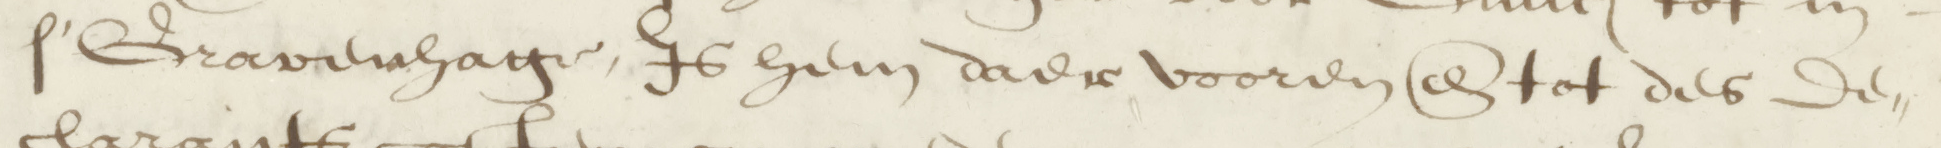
s'Gravenhage, Is hem daer vooren & tot des De„
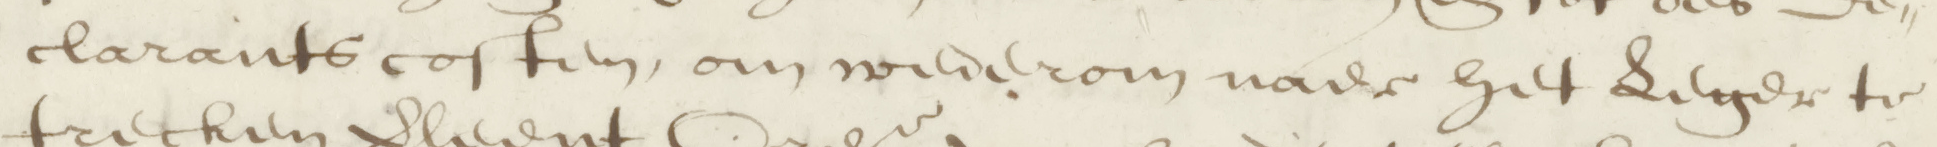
clarants costen, om wederom naer het Leger te
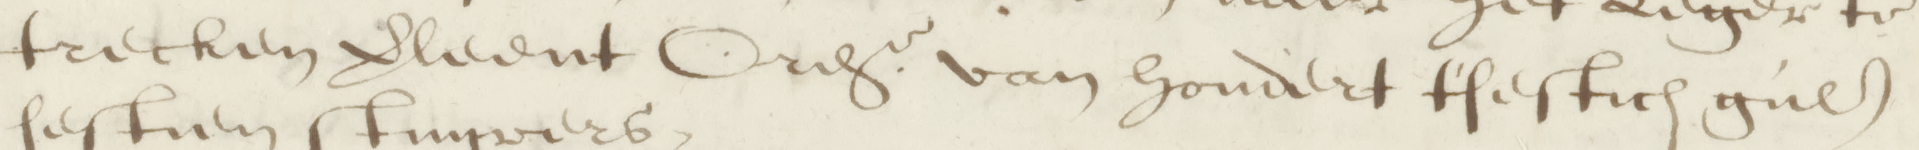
trecken vleent Orde van hondert tsestich gul
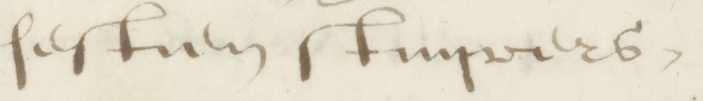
sestien stuyvers,
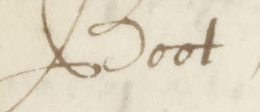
Boot
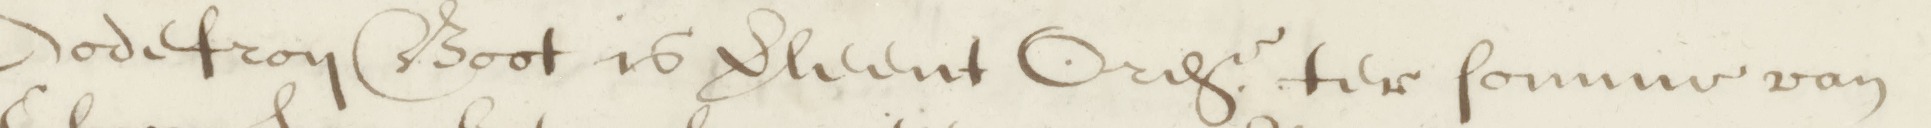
Godefroy Boot is vleent Orde. ter somme van
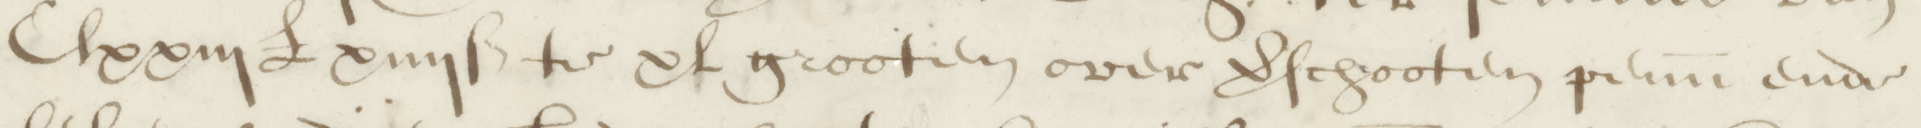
Clxxiij L xiiijß te xl grooten over vschooten penn ende
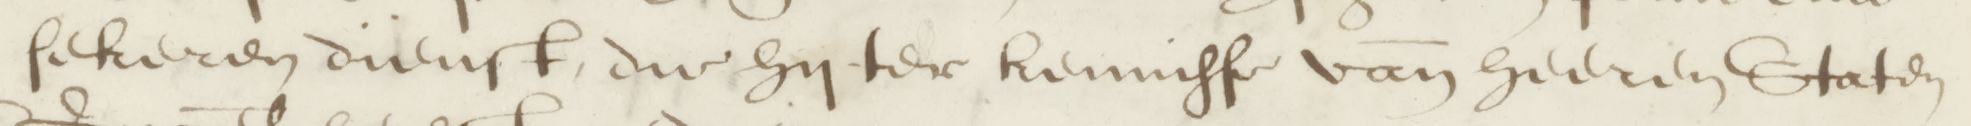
sekeren dienst, die hy ter kennisse van heeren Staten
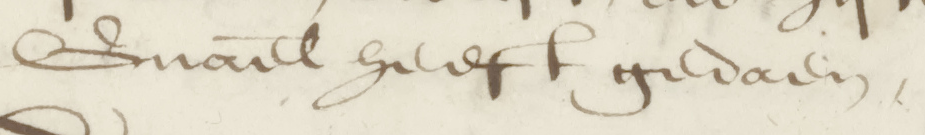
Gnael heeft gedaen.
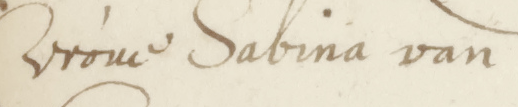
Vroue Sabina van
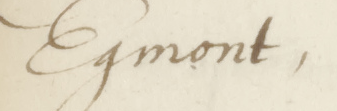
Egmont.
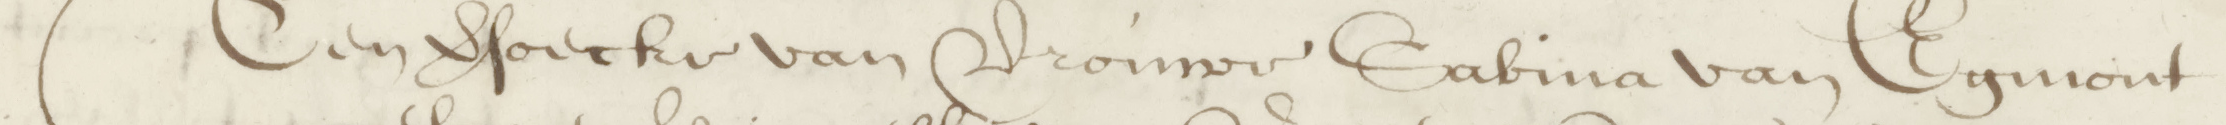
Ten vsoecke van Vrouwe Sabina van Egmont
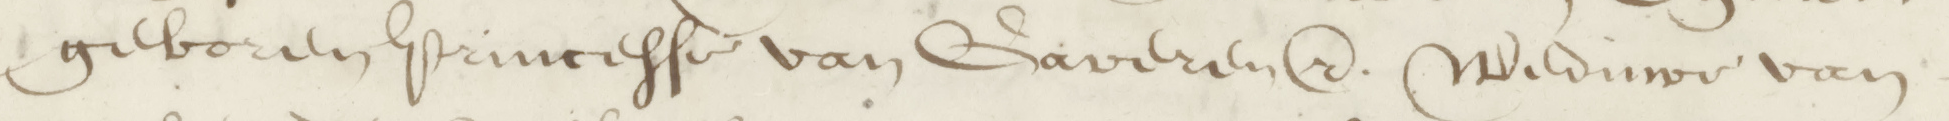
geboren Princesse van Gaveren @. Weduwe van
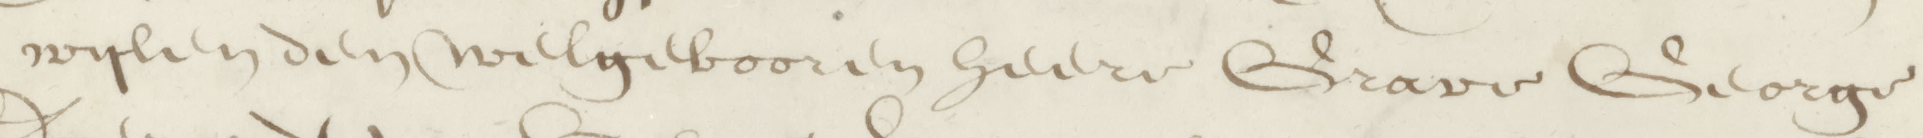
wylen den welgebooren heere Grave George
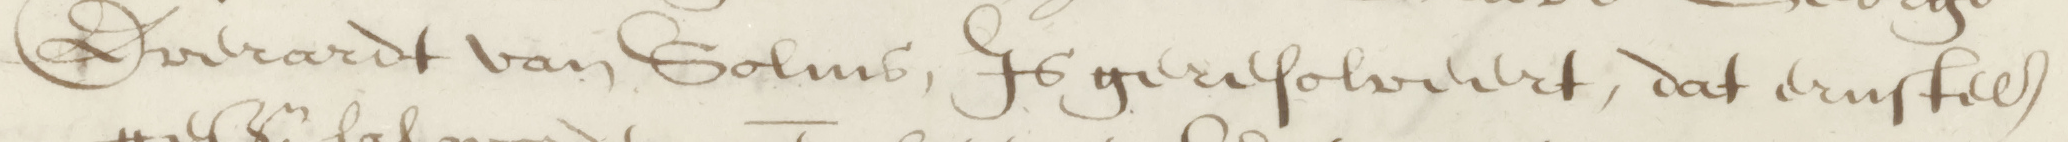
Everardt van Solms, Is geresolveert, dat ernstel
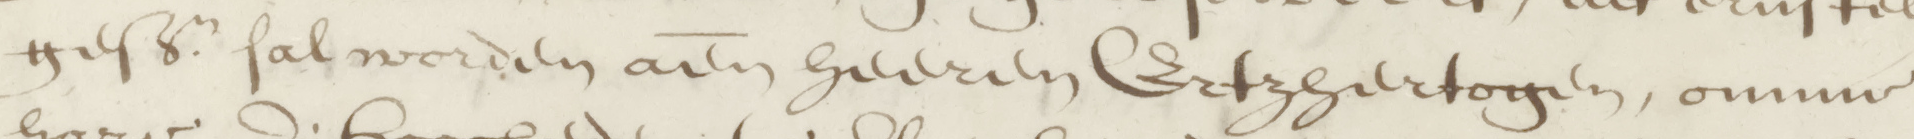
ges. sal worden aen heeren Ertzhertogen, omme
